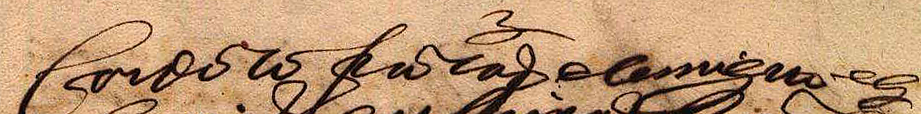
Cardozo frazaõ e comiguo es
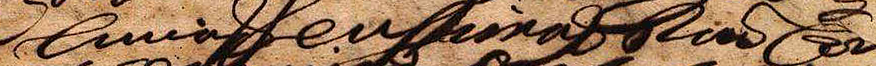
criuaõ eu simaõ Rois̄ Cor
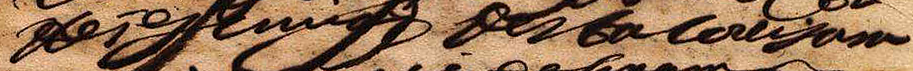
ttes escriuaõ desta coreisam
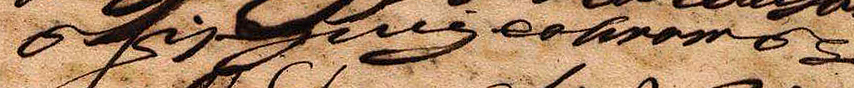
o fis escreuy e asinamos
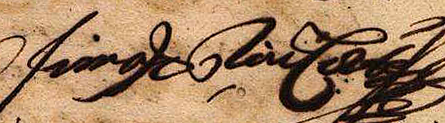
Simaõ Rois̄ Cortez
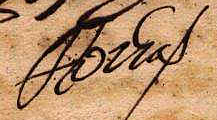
Rocha
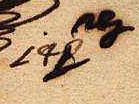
141 res
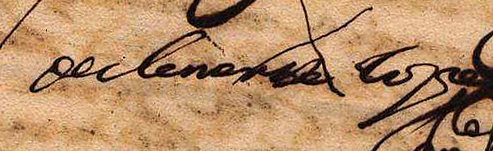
de clemente lope
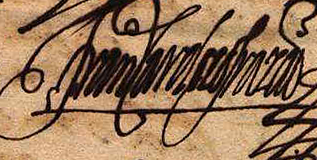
Fanco Cardozo frazão
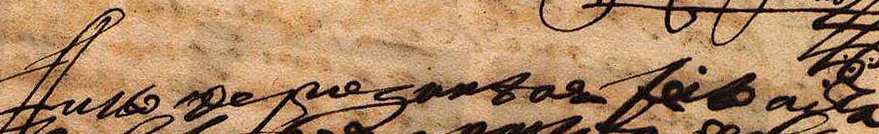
Autto de preguntas feito a iza
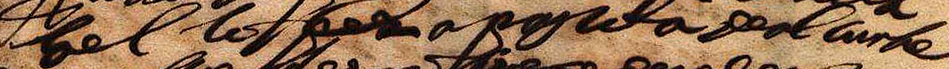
bel lopes a pascoa de alcunha
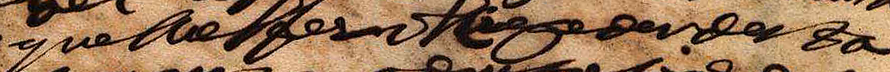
que lhe fes o Coregedor desta
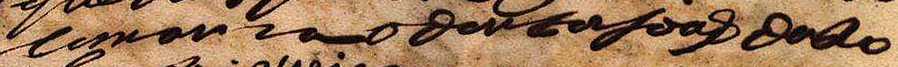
comarca o doutor Joaõ da Ro
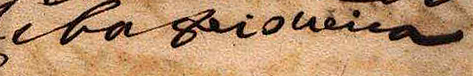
cha teixeira
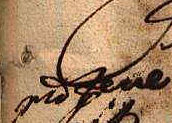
não teue
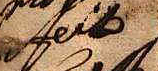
efeito
